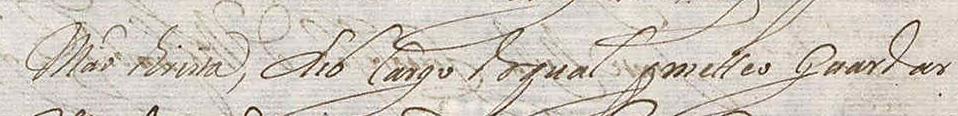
Mão direita, Sob Cargo do qual ꝑmeteo Guardar
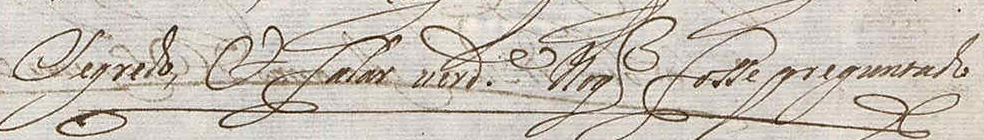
Segredo, & falar uerd.e No q̄ fosse preguntado
